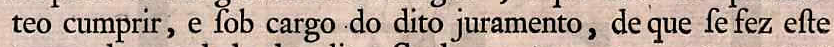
teo cumprir, e sob cargo do dito juramento, de que se fez este
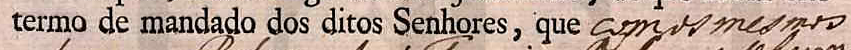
termo de mandado dos ditos Senhores, que com os mesmos
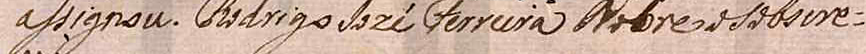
assignou. Rodrigo Iozé Ferreira Nobre o sobscre
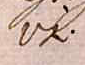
vi.
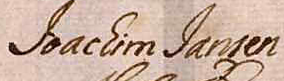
Ioachim Iansen
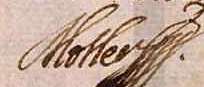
Moller.
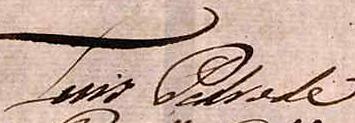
Luis Pedro de
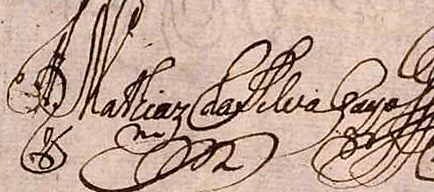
Mathias da Silua Gayo
